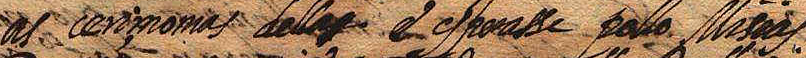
as cerimonias dellas e esperasse pollo Misias
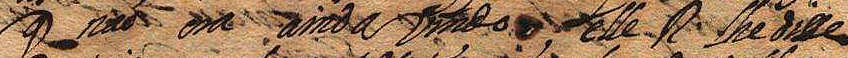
q̄ naõ era ainda vindo elle R lhe disse
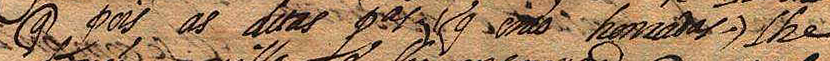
q̄ pois as ditas pas q̄ eraõ honradas, lhe
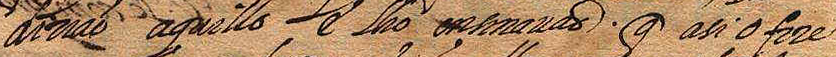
diziaõ aquillo e lho ensinauaõ q̄ asi o fize
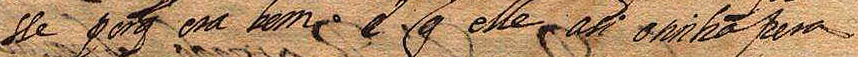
sse porq̄ era bom e q̄ elle asi o tinha pera
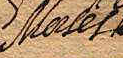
Moises
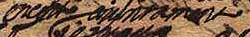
en certo aiuntamento
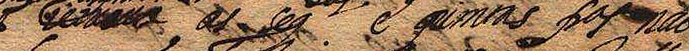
ieiuaua as segdas e quimtas fras naõ
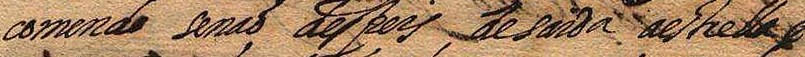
comendo senaõ despois de saida a estrella e
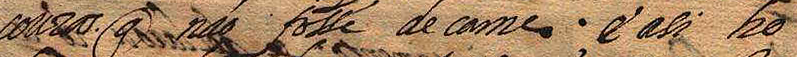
couzas q̄ naõ fossē de carne e asi ho
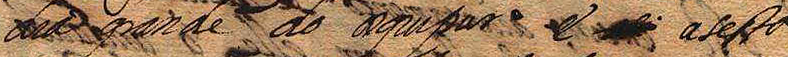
dia grande do _quipur e _ a sesta
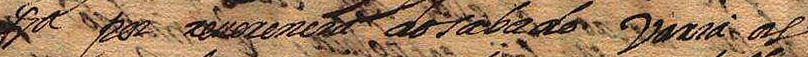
fra por reuerencia do sabado varia as
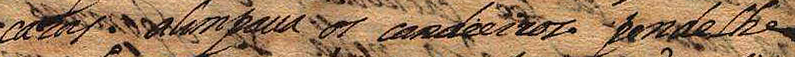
cazas alimpaua os candeeiros pondolhe
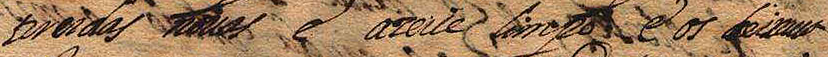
torcidas nouas e azeite limpo e os deixaua
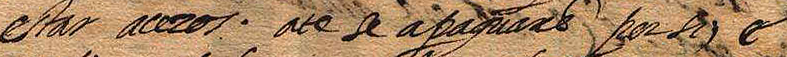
estar acezos ate se apaguarē por si; e
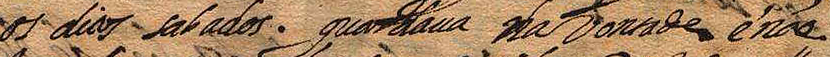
os ditos sabados guardaua na vontade e naõ
